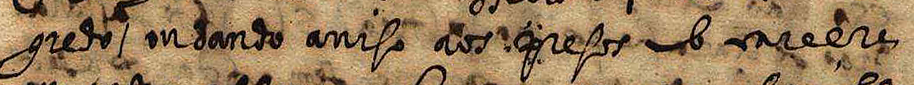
gredo / ou dando auiso aos presos do carcere
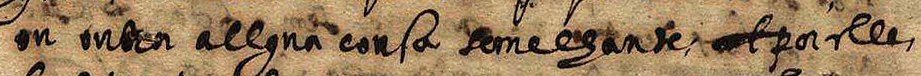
ou outra allgua cousa semelhante, E por elle,
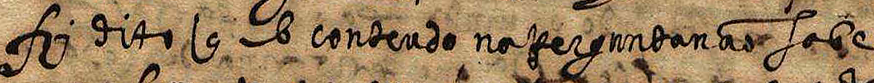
foy dito q̄ do conteudo na pergunta não sabe
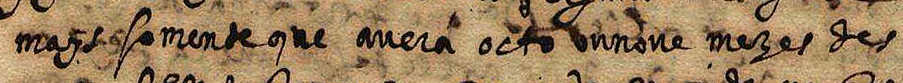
mays somente que auera oito ou noue mezes des
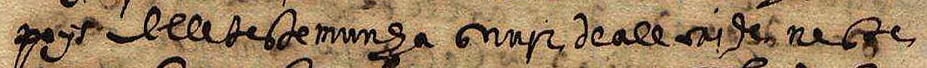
poys delle testemunha serujr de allcajde neste
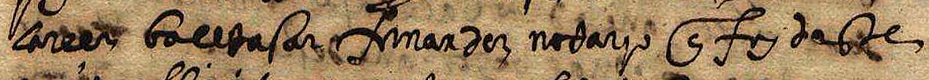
carcer balltasar fernandez notarjo q̄ foj deste
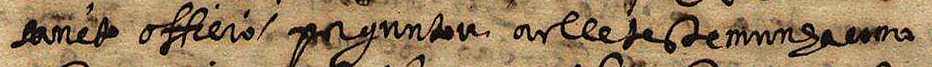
sancto officio / perguntou a elle testemunha como
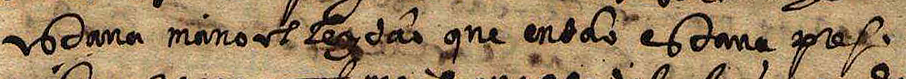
estaua manoel leytão que então estaua preso
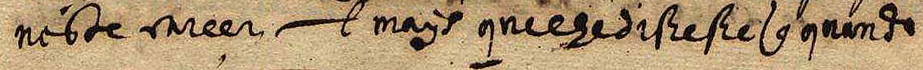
neste carcer E mays que lhe dissesse q̄ quando
